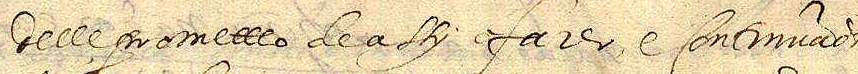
delle prometteo de assy o fazer e Continuādo
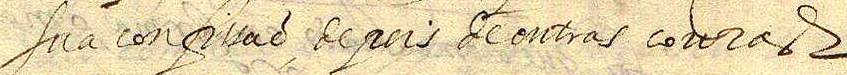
sua confissaõ, depois de outras couzas E
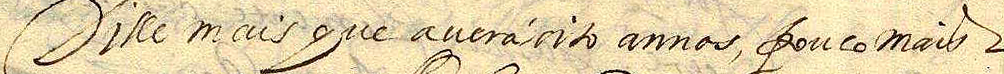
Disse mais que auerá oito annos, pouco mais
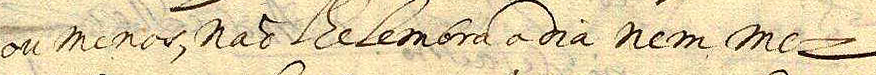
ou menos, naõ lhe lembra o dia nem mez
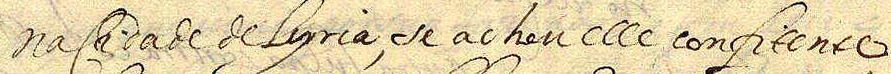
na Cidade de Leyria, se achou elle confitente
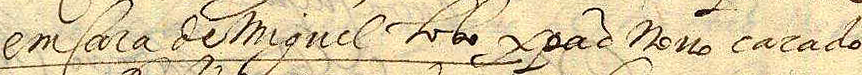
em Caza de Miguel lobo xpaõ nouo cazado
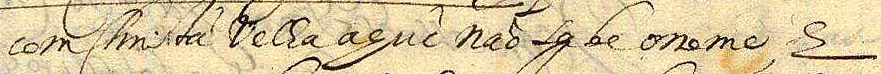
com Christã velha a quē naõ sabe o nome, E
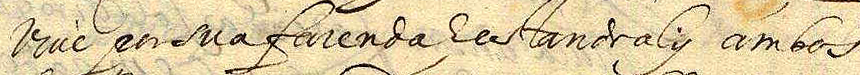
viue per sua fazenda, E estando aly ambos
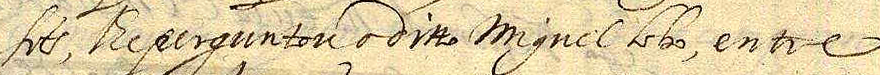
sos, lhe perguntou o ditto miguel lobo, entre
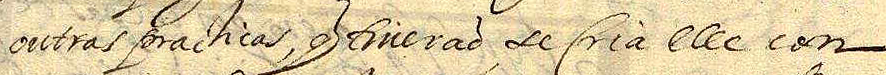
outras practicas, q̄ tiueraõ, se Cria elle con
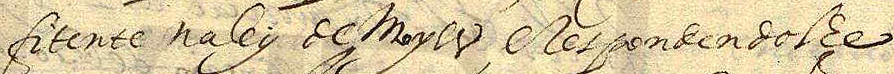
fitente na ley de Moyses, e respondendo lhe
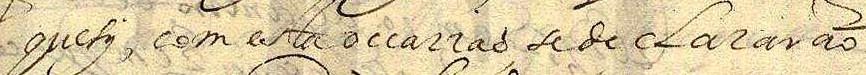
que sy, com esta occaziaõ, se declararão
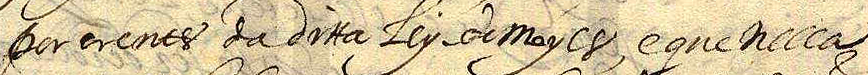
per crentes da ditta Ley de moyses, e que nella
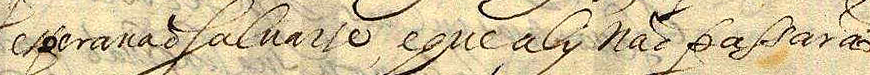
esperauaõ saluarse, e que aly não passaraõ
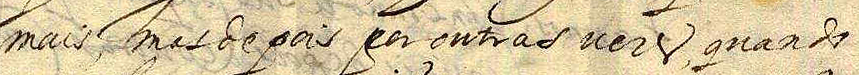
mais, mas depois per outras uezes, quando
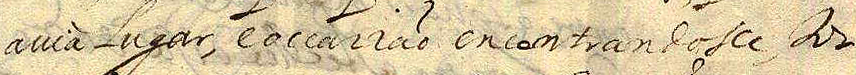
auia Lugar, e occaziaõ encontrandosse, tor
